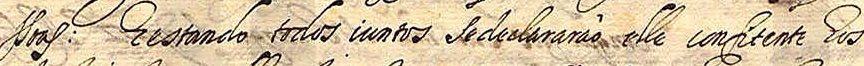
ssoas: E estando todos iuntos Se declararaõ elle confitente E os
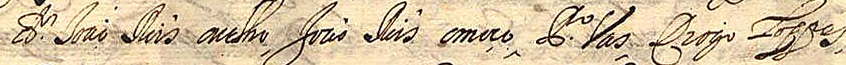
d̄os. Ioaõ Rois̄ o uelho, Joaõ Rois̄ o moço, P.o Vas, Diogo Loppes,
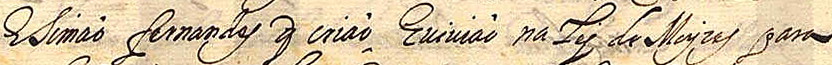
E Simaõ fernandes q̄ criaõ, E uiuiaõ na Lej de Moyzes para
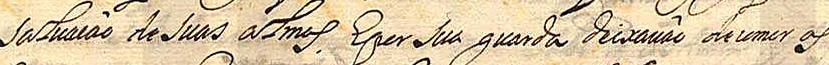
saLuacaõ de suas aLmas, E por sua guarda deixauaõ de comer as
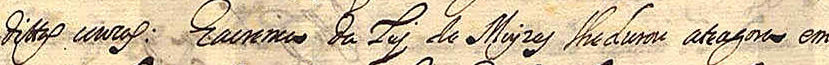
dittas couzas: E a crenca da Lej de Moyzes lhe durou ate agora em
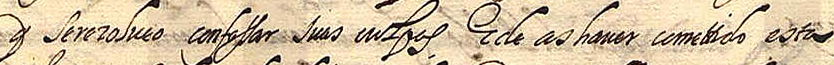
q̄ Se rezolueo confessar suas cuLpas, E de as hauer comettido esta
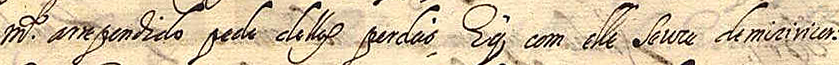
mto. arrependido pede dellas perdaõ, E q̄ com elle Se uze de miziricor
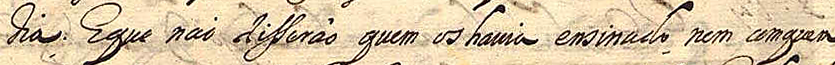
dia; E que naõ disserão quem os hauia ensinado, nem com quem
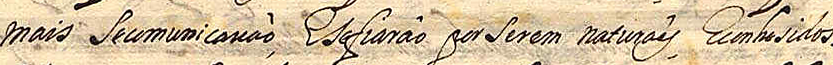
mais Se comunicauaõ, E se fiaraõ por serem naturaēs, E conhesidos.
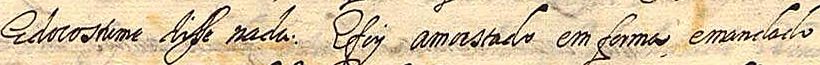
E do costume disse nada. E foy amoestado em forma, e mandado
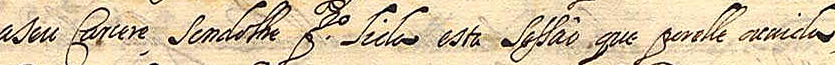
a seu Carcere, Sendolhe p.ro Lida esta Sessão que por elle ouuida
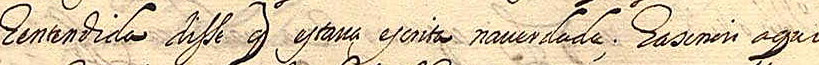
E entendida disse q̄ estaua escrita na uerdade; E asinou aqui
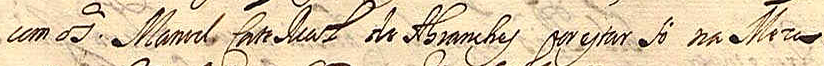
com o sor. Manoel Corte ReaL de Abranches por estar só na Meza.
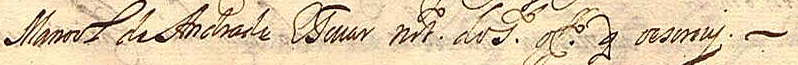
ManoeL de Andrade E Touar not.to do sto. off.o q̄ o escreuj. ~
